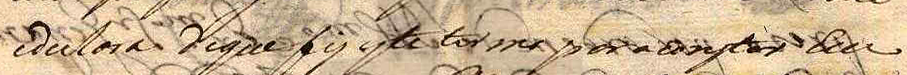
e declara de que fis este termo para constar E eu
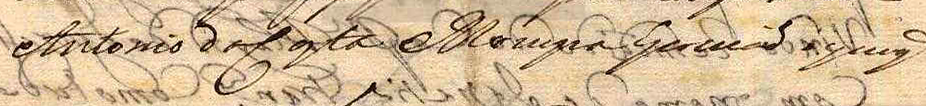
Antonio da Costa Moreya Escriuaõ o escrevj
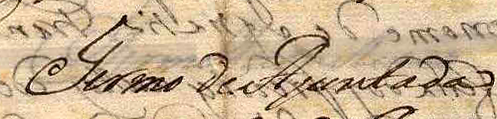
Termo de Ajuntada
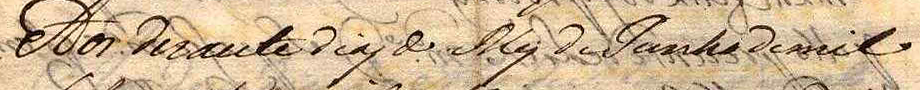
Aos dezacete dias do Mes de Iunho de mil
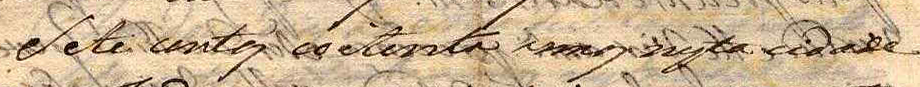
setecentos e oitenta annos nesta cidade
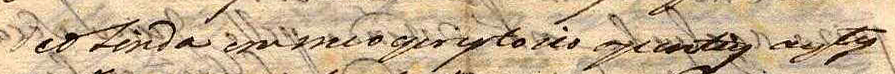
de oLinda em meo escriptorio ajuntey a estes
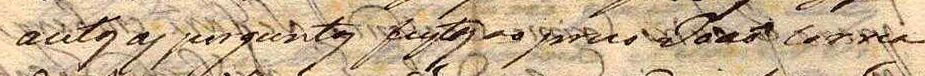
autos as perguntas feytas ao prezo Ioaõ Correa
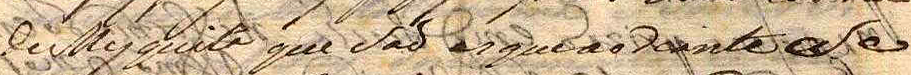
de Mesquita que saõ as que aodiante e Se
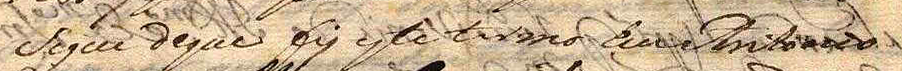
segue de que fis este termo E eu Antonio
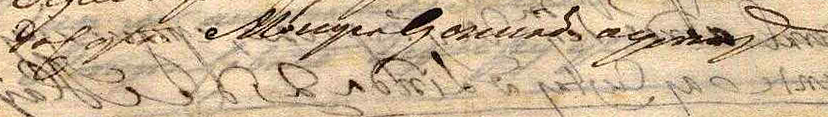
da Costa Moreyra Gauuaõ o escrevj
